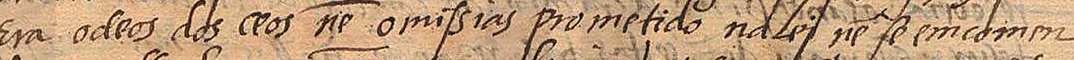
Era o deos dos ceos nē o missias prometido na Lej nē se emcomen
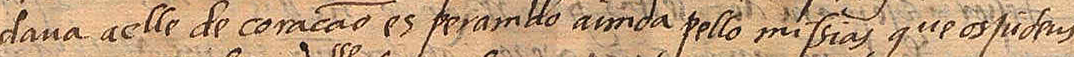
daua a elle de coracão esperamdo aimda pello missias que os Judeus
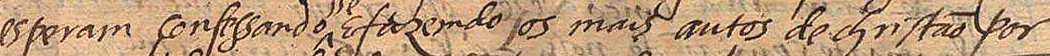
esperam confessandosse E fazemdo os mais autos de christão por
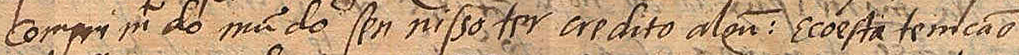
comprimto do mūdo sen nisso ter credito algū: E co esta temcão
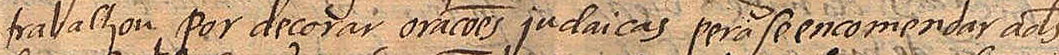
trabalhou por decorar oracões judaicas pera se encomendar a d̄s
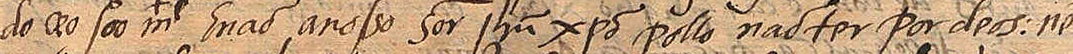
do ceo soomte E naõ a nosso Sōr jhū xpō pollo naõ ter por deos: nē
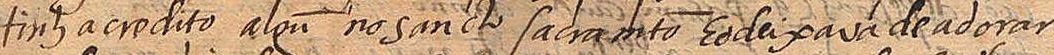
tinha credito algū no Sancto sacramtō E o deixava de adorar
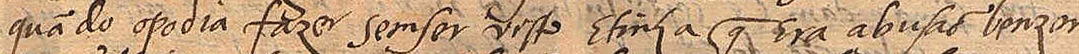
quādo o podia fazer sem ser visto E tinha q̄ era abusaõ benzer
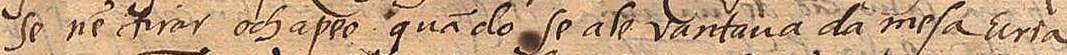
se nē tirar o chapeo quādo se alevantaua da mesa E cria
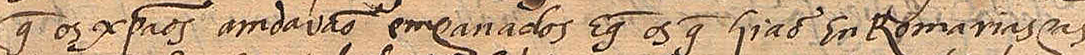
q̄ os xp̄aos amdavão emganados E q̄ os q̄ hiaõ En Romarias gas
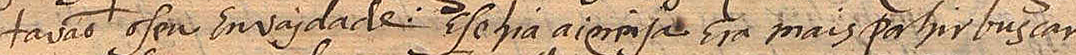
tavão o seu En vajdade: E se hia a igreja Era mais por hir buscar
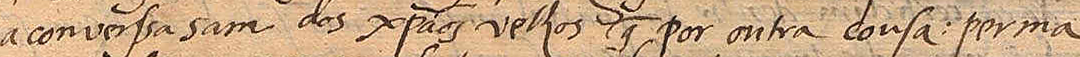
a conversasam dos xpãos velhos q̄ por outra cousa: perma
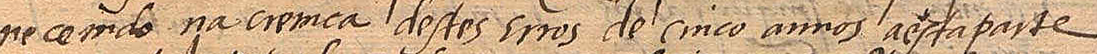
necemdo na cremca destes Erros de cinco annos a esta parte
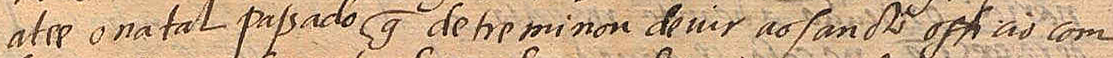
atee o nataL passado q̄ detreminou de uir ao sancto officio com
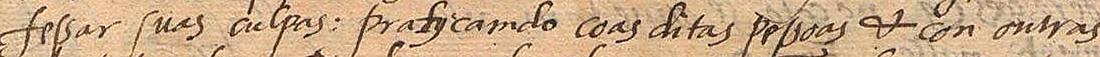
fessar suas culpas: pratycando co as ditas pessoas & con outras
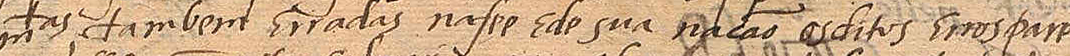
mtas tambem Erradas na fee E de sua nacão os ditos Erros pare
